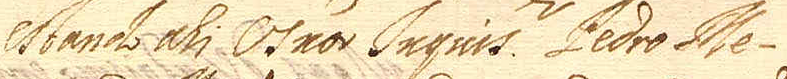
estando ahi O Sn̄or Inquis.or Pedro Me
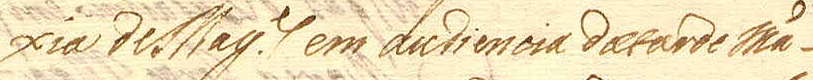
xia de Mag.es em audiencia da tarde Mā
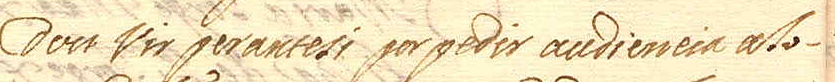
dou Vir perante si por pedir audiencia a Io
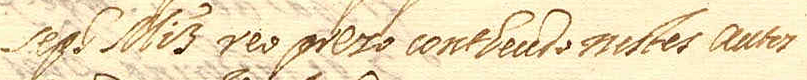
seph Miz̄ reo prezo contheudo nestes autoz
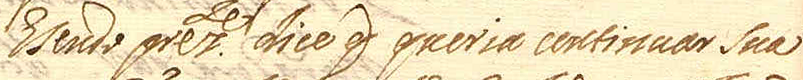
E sendo prez.te dice q̄ queria continuar sua
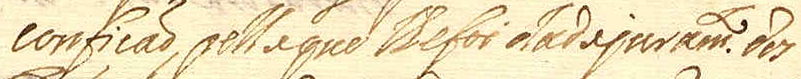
confiçaõ, pello que lhe foi dado juram.to doz
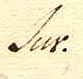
Iur.
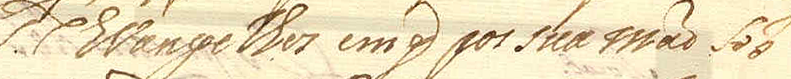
s.tos Evangelhos em q̄ pos sua maõ sob
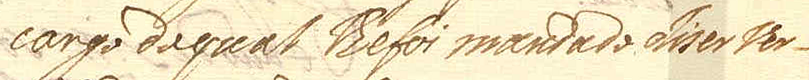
cargo do qual lhe foi mandado dizer ver
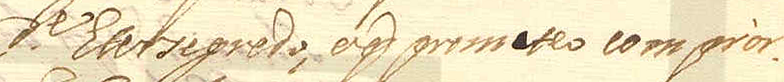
d.e E ter segredo, o q̄ prometeo comprir.
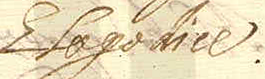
E logo dice.
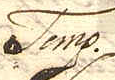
Temp.
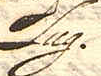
Lug.
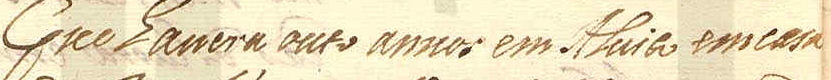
Que hauera, outro annos em Aluito em casa
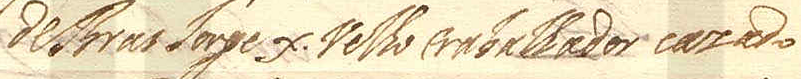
de Bras Iorge x. Velho trabalhador cazado
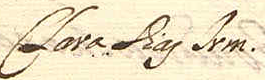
Clara Dias Irm.
